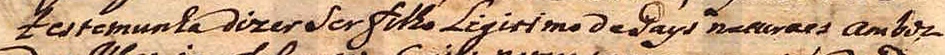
testemunha dizer ser filho Ligitimo de Pays naturaes amboz
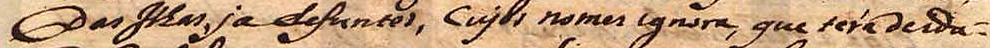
Das Jlhas, ja defuntos, cujos nomes ignora, que terá de ida
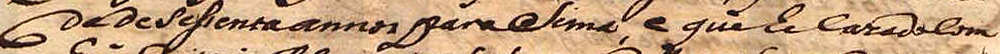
da de sessenta annos para Sima, e que he Cazado com
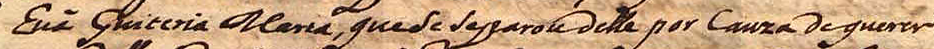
huā Quiteria Maria, que se separou delle por cauza de querer
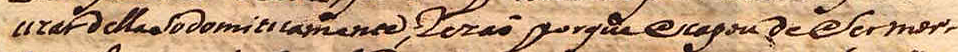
uzar della sodomiticamente, Rezaõ porque escapou de Ser mor
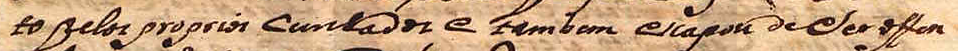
to pelos proprios cunhados, e tambem escapou de ser offen
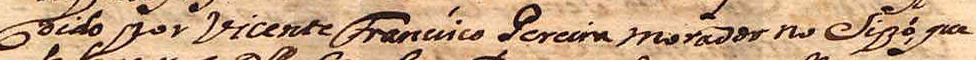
dido por Vicente Francisco Pereira morador no Sipó, que
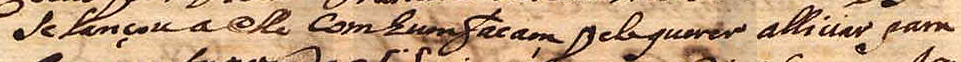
se lançou a elle com hum facam, pelo querer alliciar para
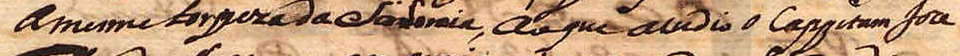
a mesma torpeza da Sodomia, Ao que acudio o Cappitam Joze
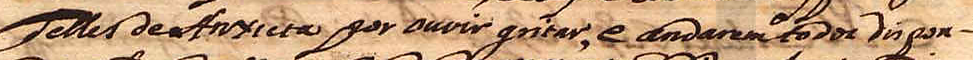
Telles de Anxieta por ouvir gritar, e andarem todos dispon
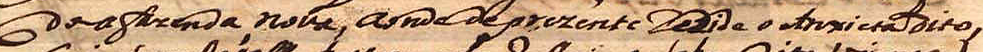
do a fazenda nova, aonde de prezente Rezide o Anxieta dito,
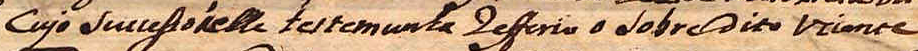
Cujo successo a elle testemunha Refferio o sobredito vicente
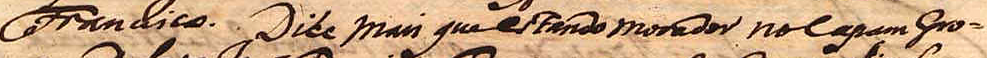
Francisco. Dice mais que estando morador no Capam Gro
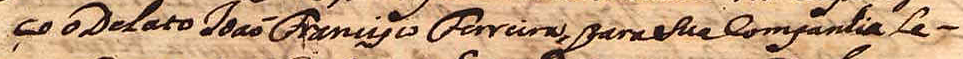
ço o Delato Ioaõ Francisco Ferreira, para sua Companhia Le
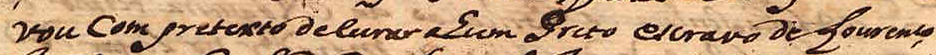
vou com pretexto de curar a hum Preto escravo de Lourenço
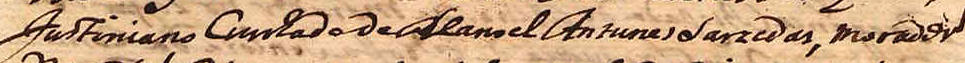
Justiniano Cunhado de Manoel Antunes sarzedas, morador
